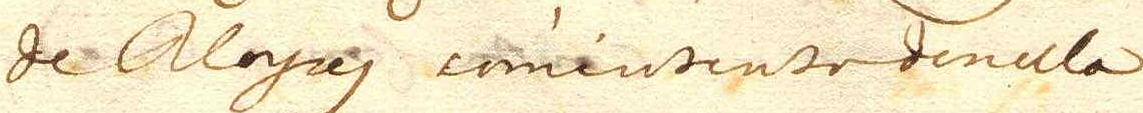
de Moyzes com intento de nella
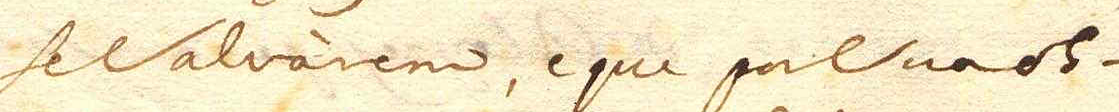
se salvàrem, e que por sua ob
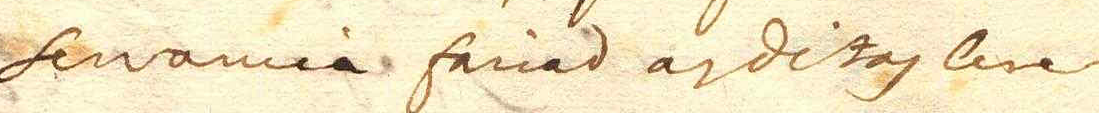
servancia faziaõ as ditas cere
